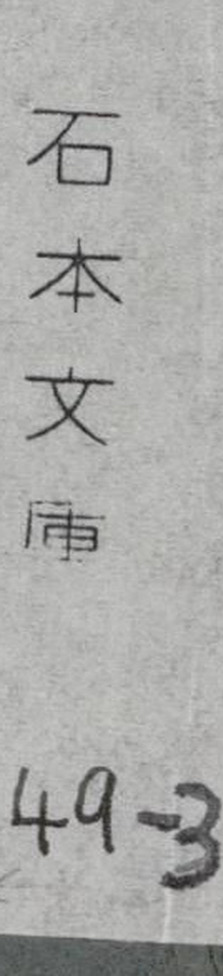石本文庫-
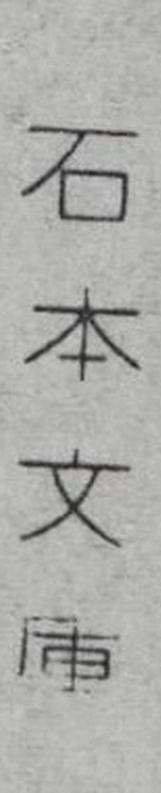石本文庫-
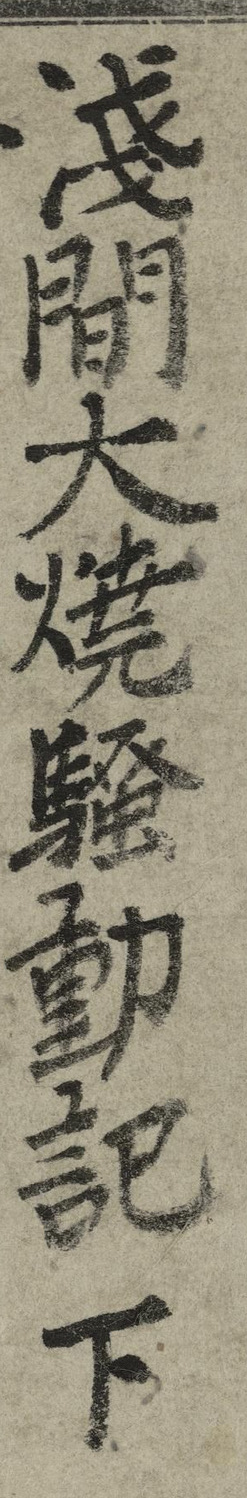浅間大焼騒動記下

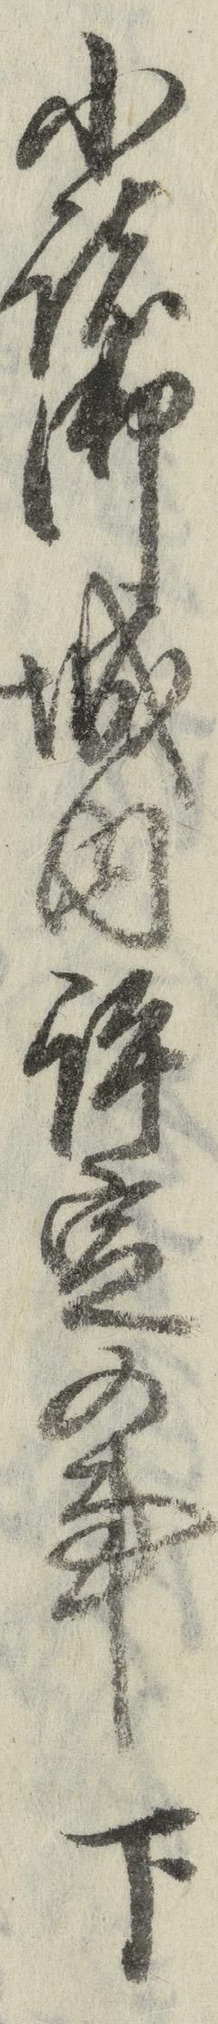小諸御城内評定の事下
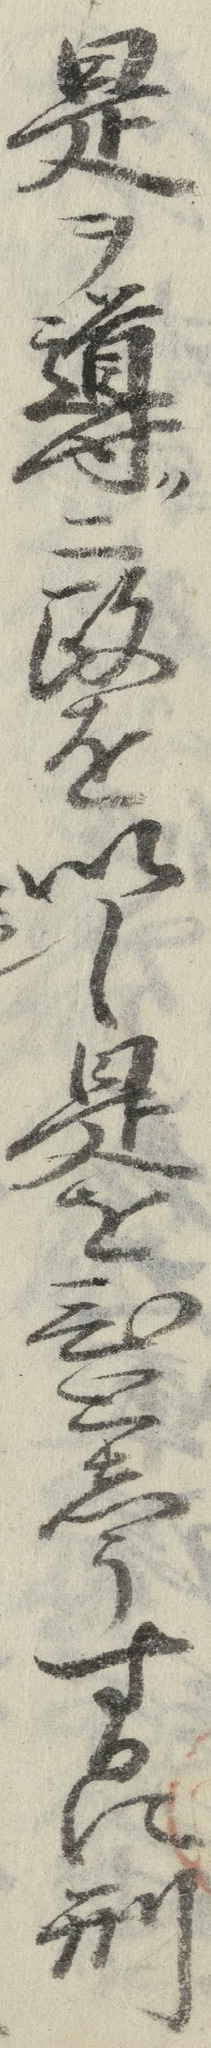是ヲ導政を以し是をひとしうするに刑
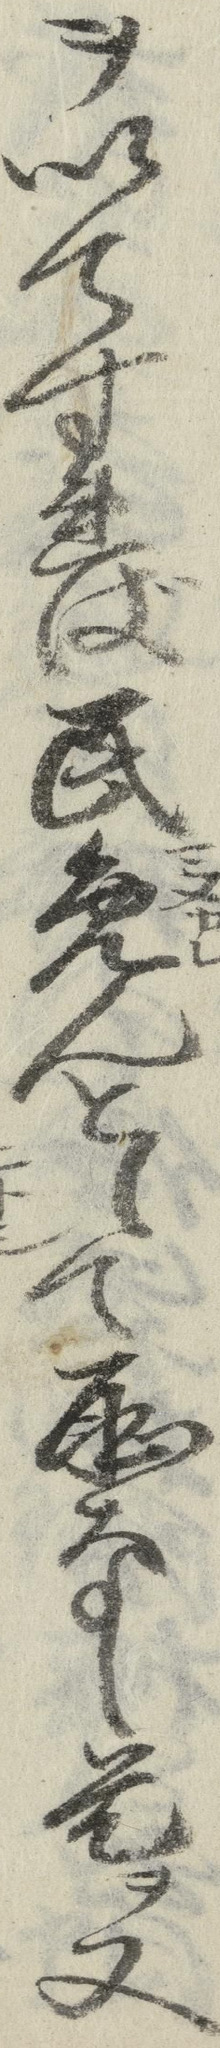ヲ以てすれば民免んとして恥なし是又
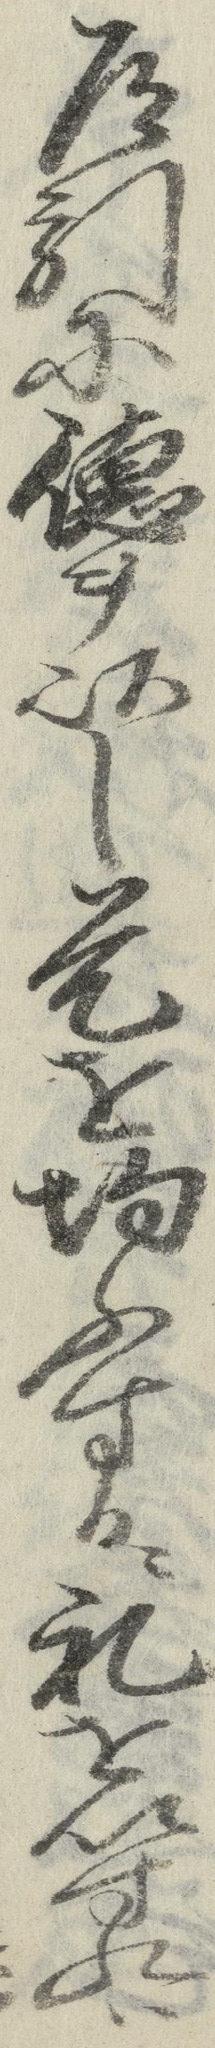道引に徳ヲ以し是を均ふするに礼を以すれは
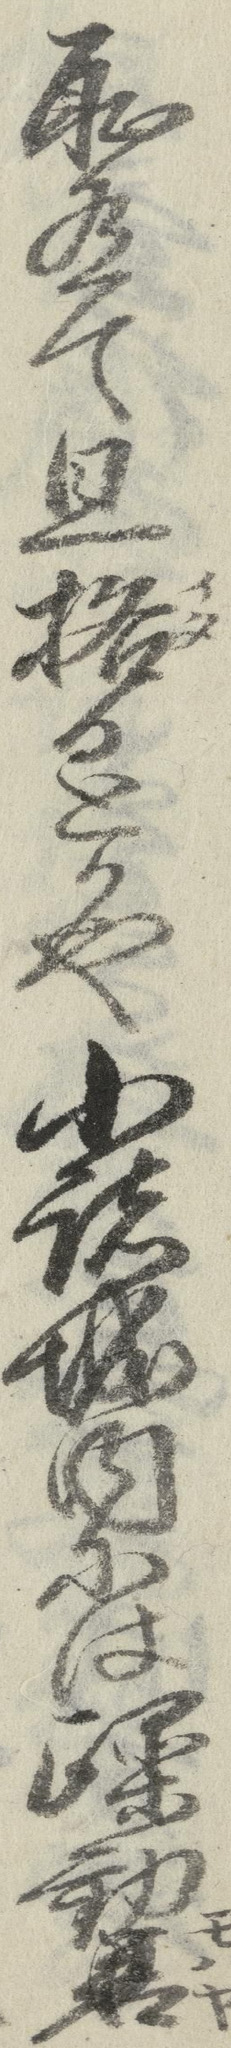恥有て且格るとかや小諸城内には躁動若
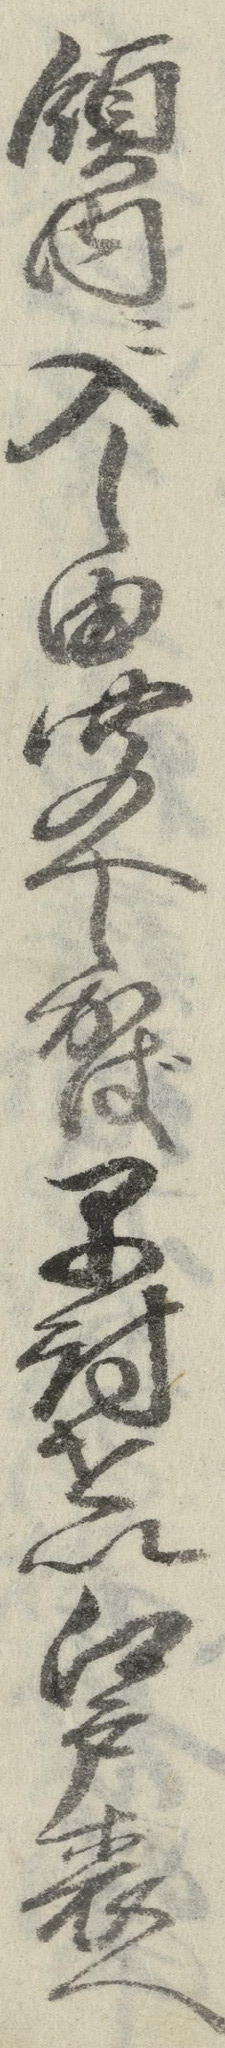領内に入し由聞へしかば早討を以江戸表へ
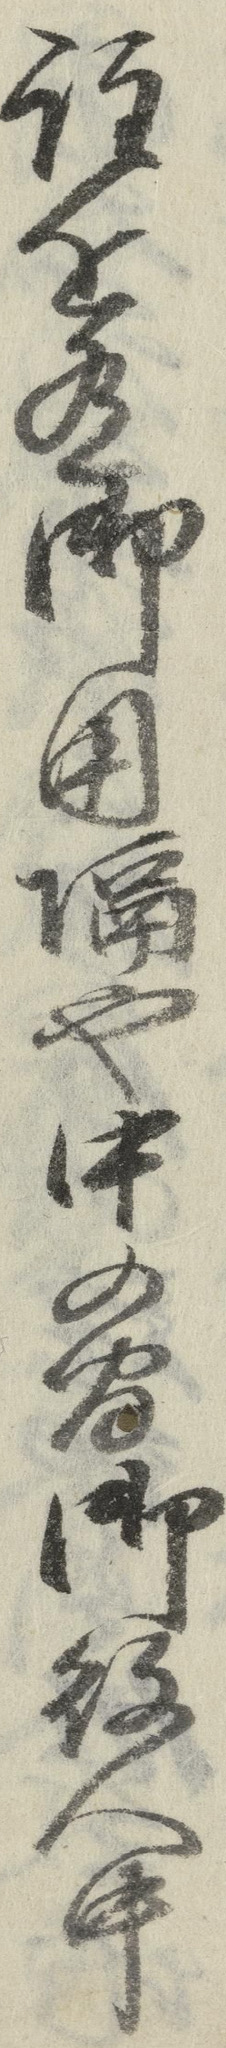注進有御用隔や中の間御役人中
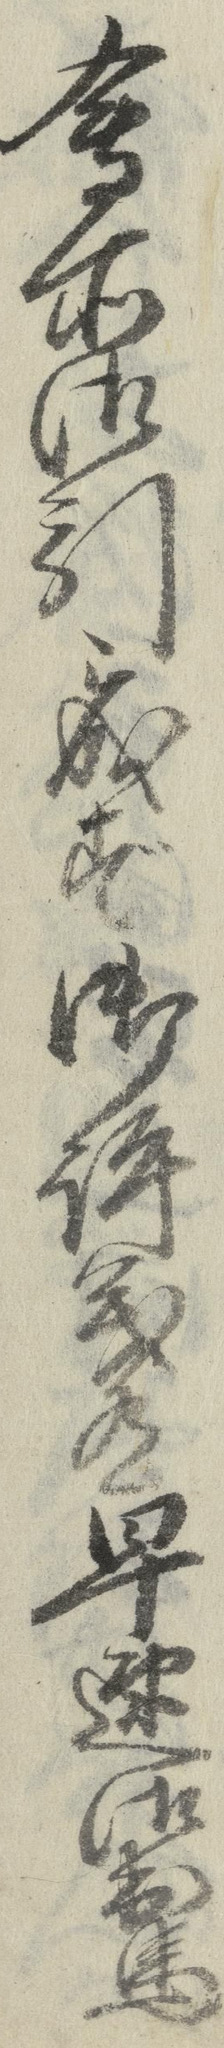会所御引被成ず御評議有早速御出馬

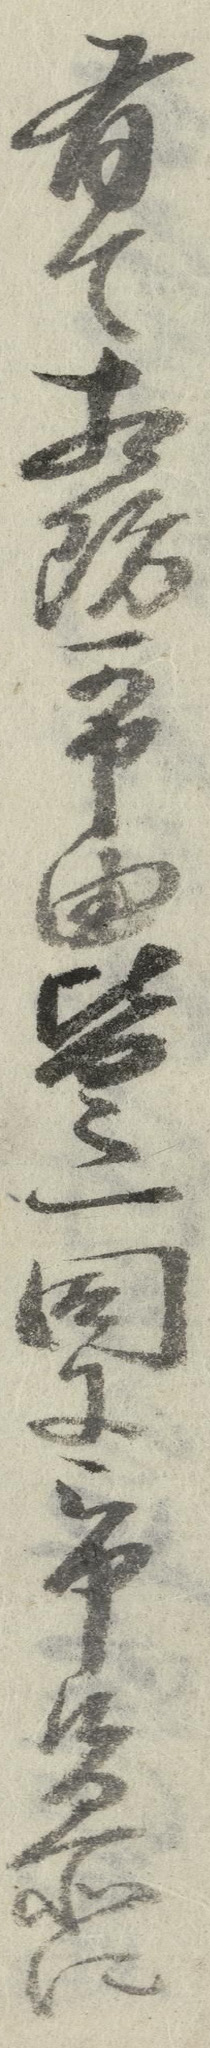有て相防可申由皆々一同に被申ける所に
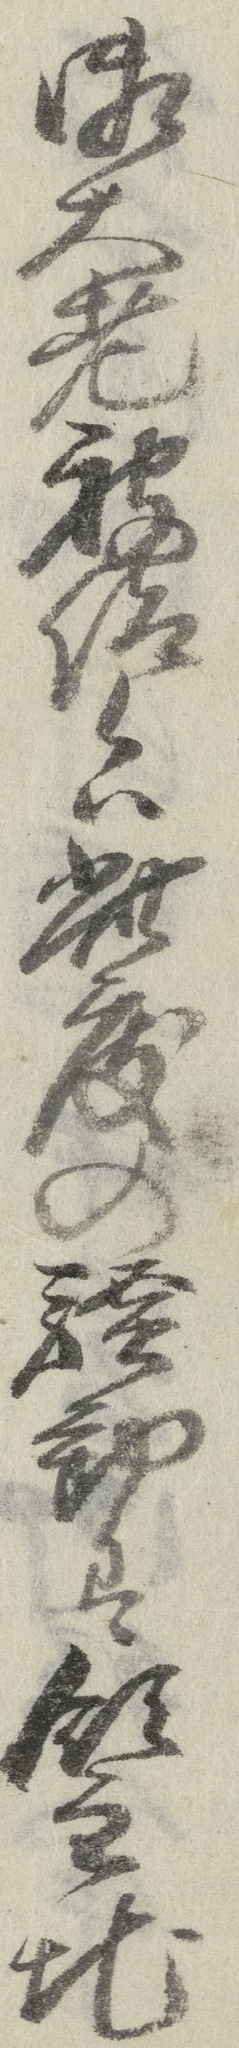御大老被仰らは此度の騒動は領主地
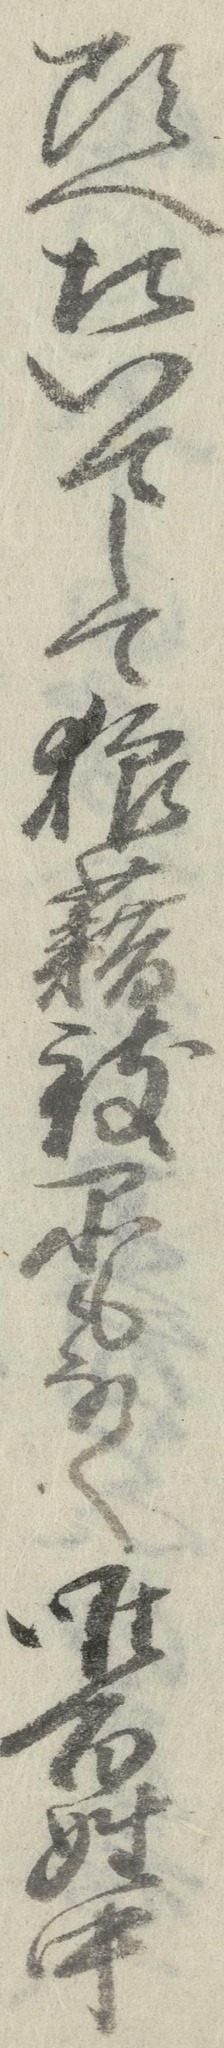頭へたいてして狼藉致所もなく唯百姓中
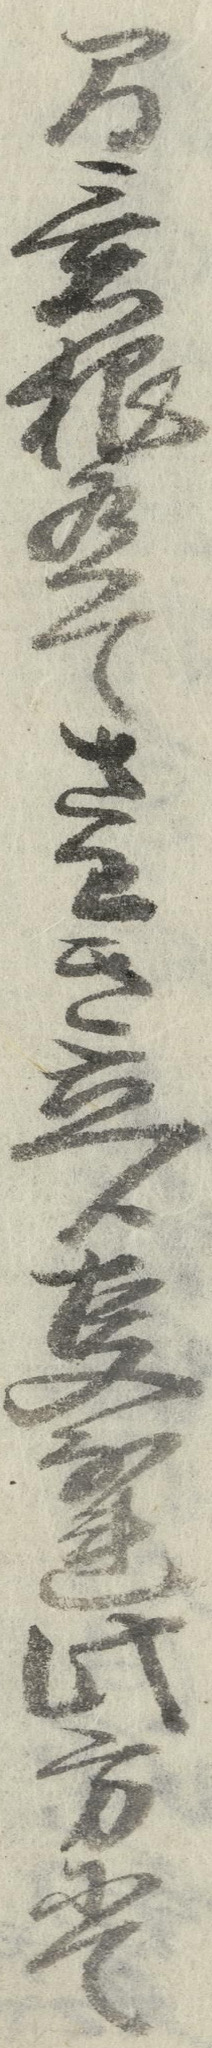間意恨有てさわき立候事なれ此方にて
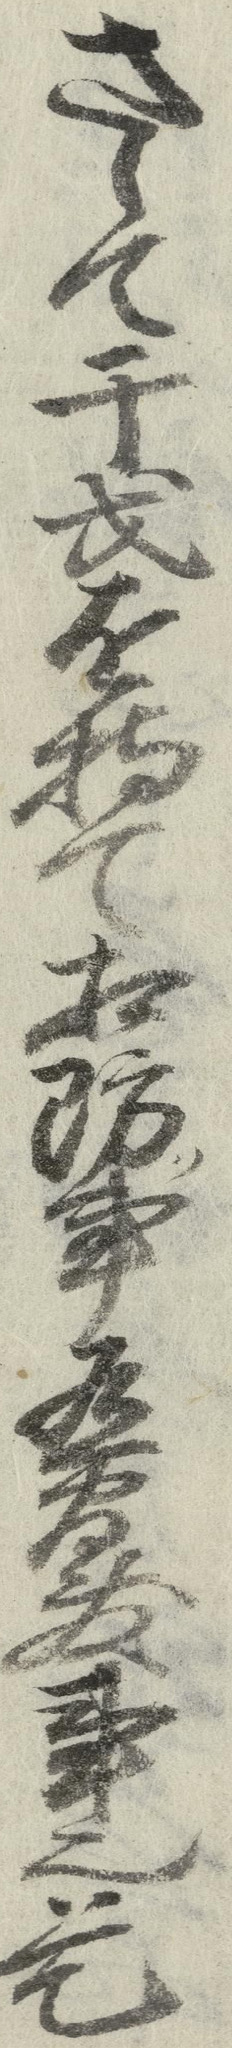さして干戈を持て相防事有間敷事也是
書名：浅間大焼騒動記　下
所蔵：東京大学地震研究所図書室 Earthquake Research Institute Library, The University of Tokyo, JAPAN
